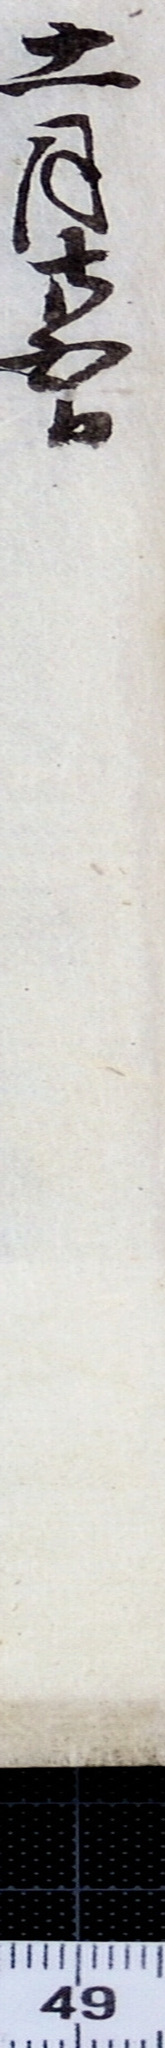十一月廿五日
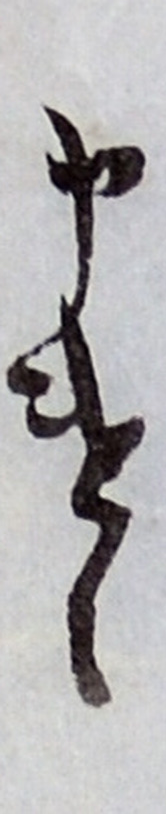申出候
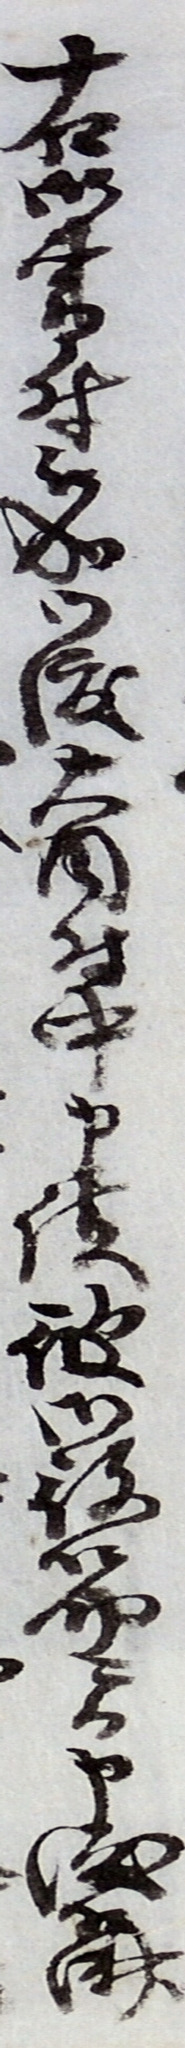右御書付被成御渡大目付中申談彼御役筋ニ而相済
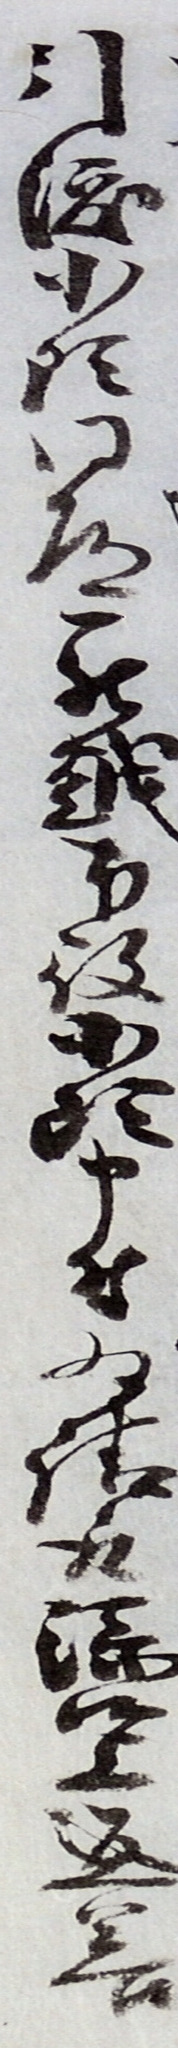引渡小頭同道罷越本役小頭申付為請取添候上返答
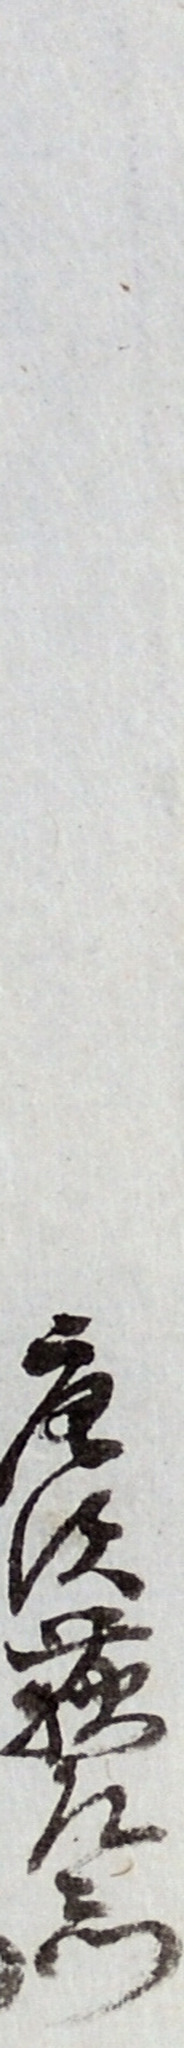唐沢萩左衛門
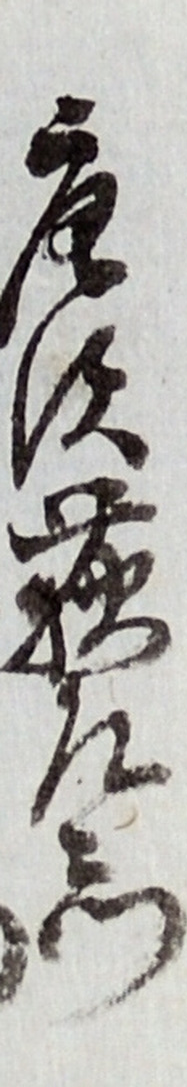唐沢萩左衛門
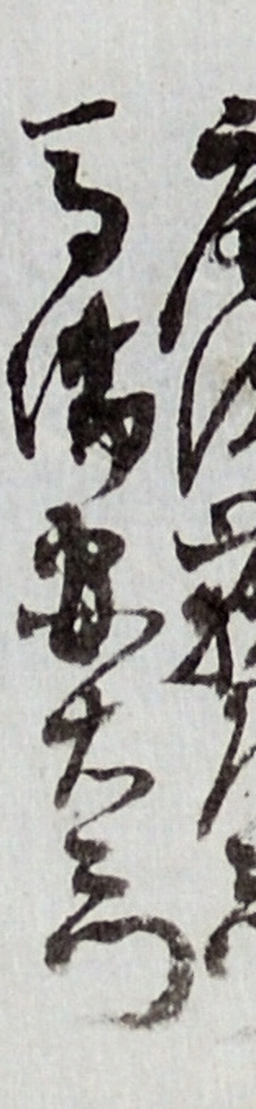馬場安右衛門
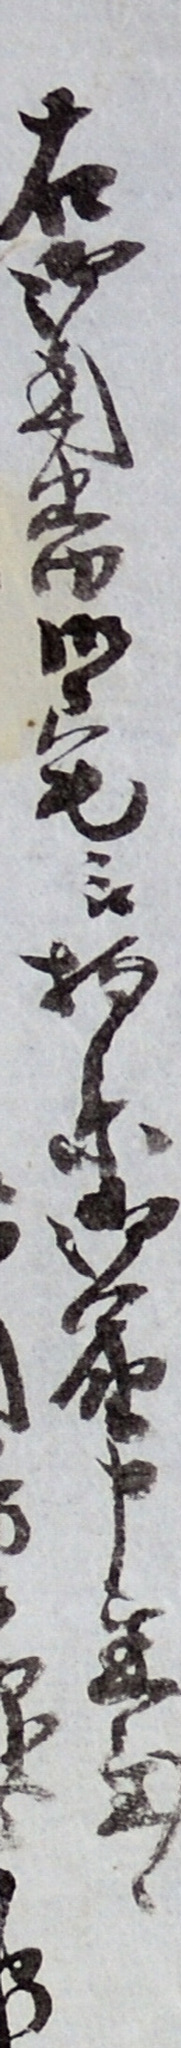右御用番御宅江持参御届申達置候
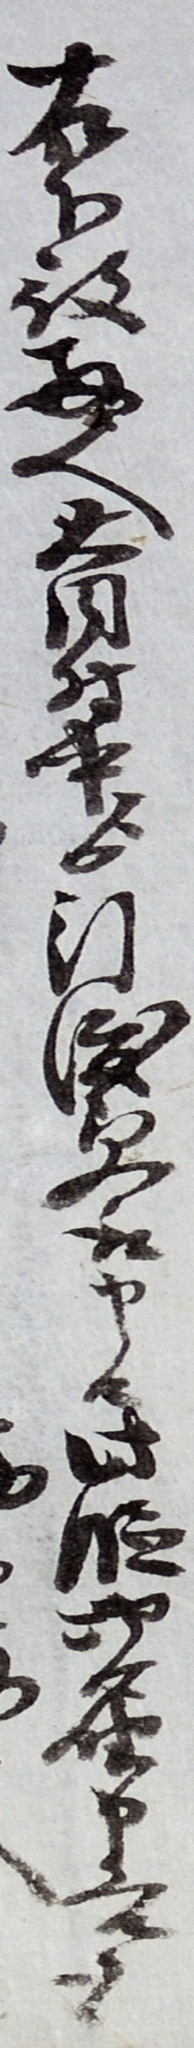右下役両人大目付ゟ引渡受取申候此段御届申上候以上
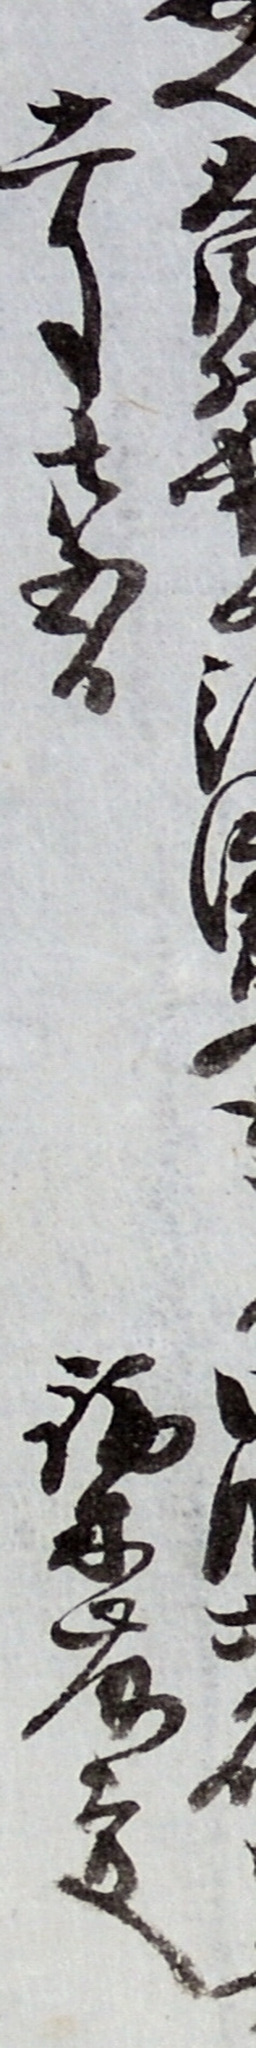十一月廿五日鈴木藤太夫
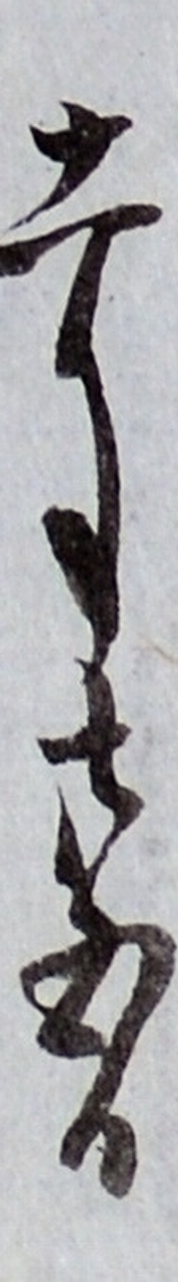十一月廿五日
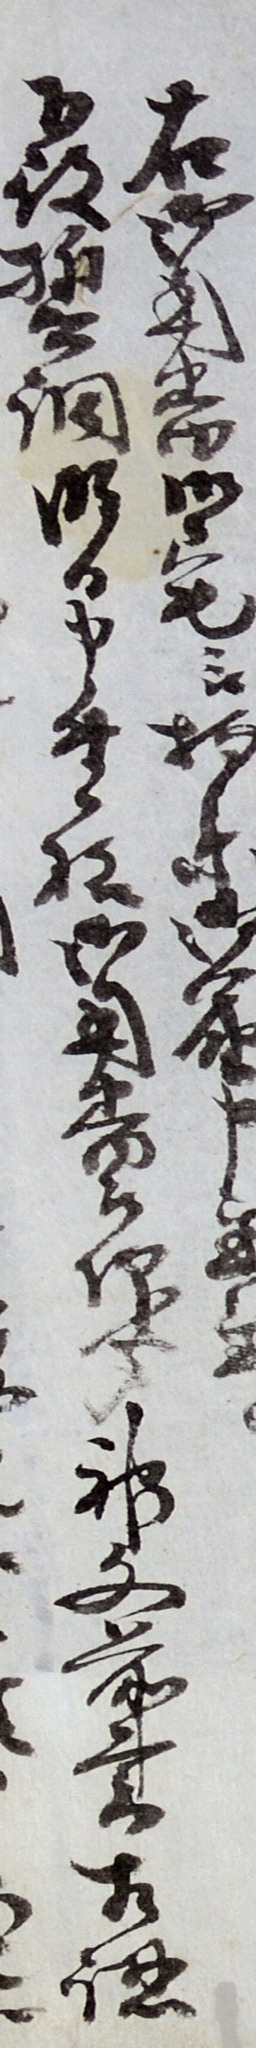一下役誓調明日申付候様御用番被仰聞神文前書相認
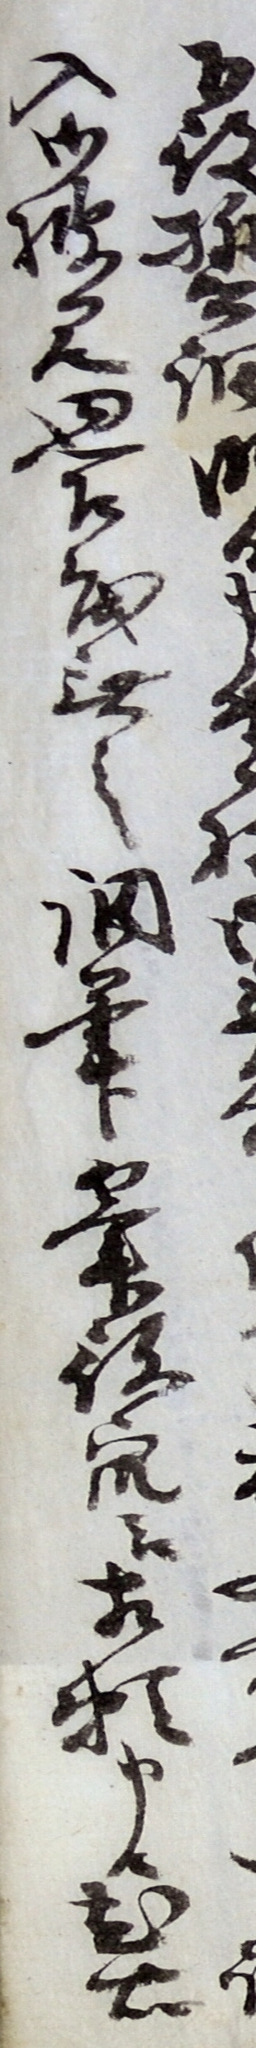入御披見思召茂無之調筆筆役衆江相頼申候尤右

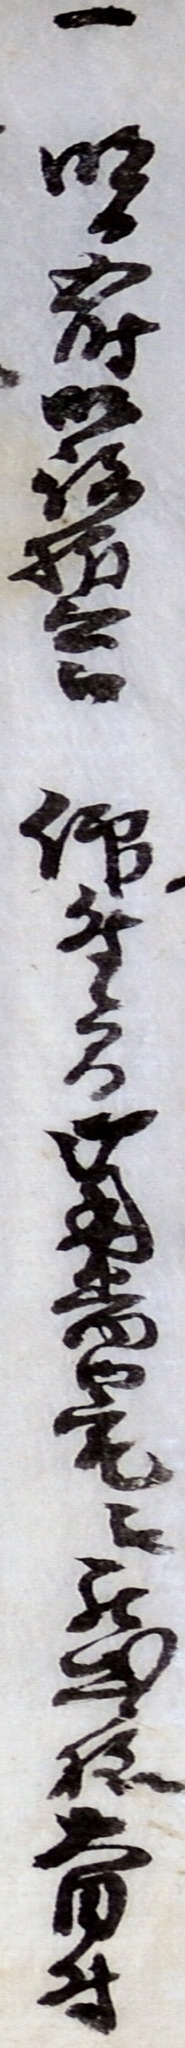一明日五時御役誓被仰付候間御用番御宅江罷出候様大目付
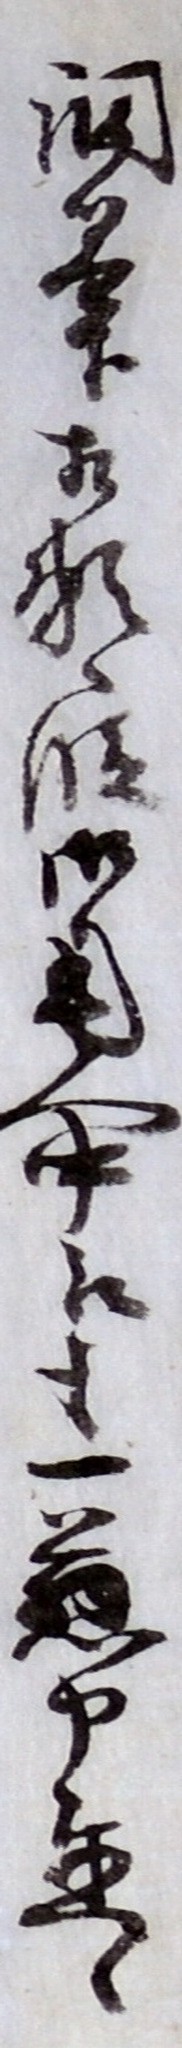調筆相頼候段御用人中江も一應申置候
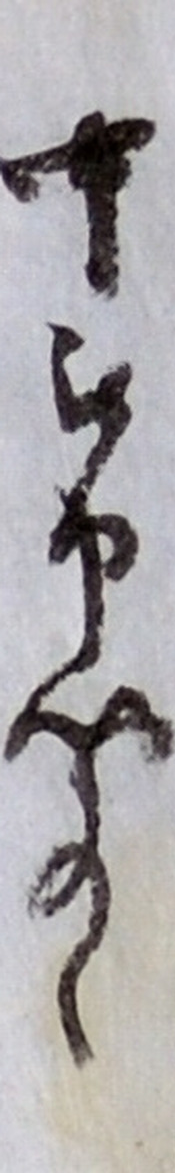中被仰聞候
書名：御山奉行御用留
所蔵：伊那市立高遠町図書館・合同会社AMANE
